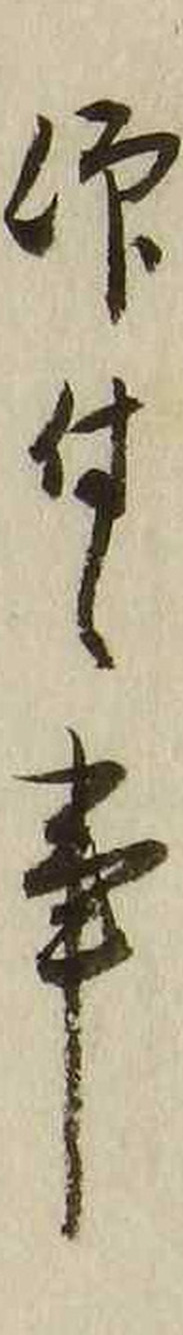仰付候事
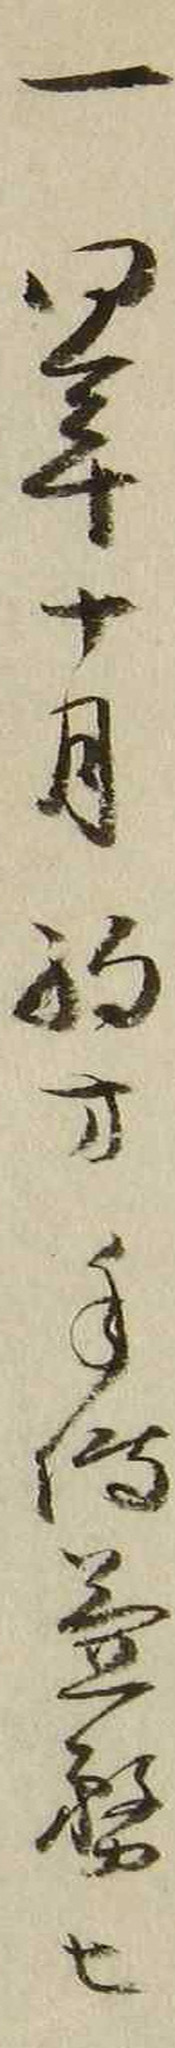一同年十月駒方手伝兼務被
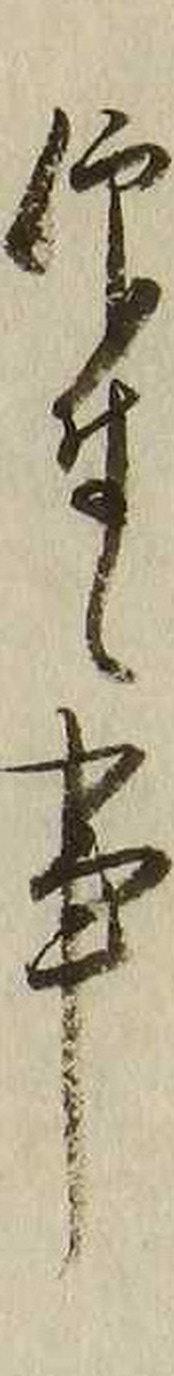仰付候事
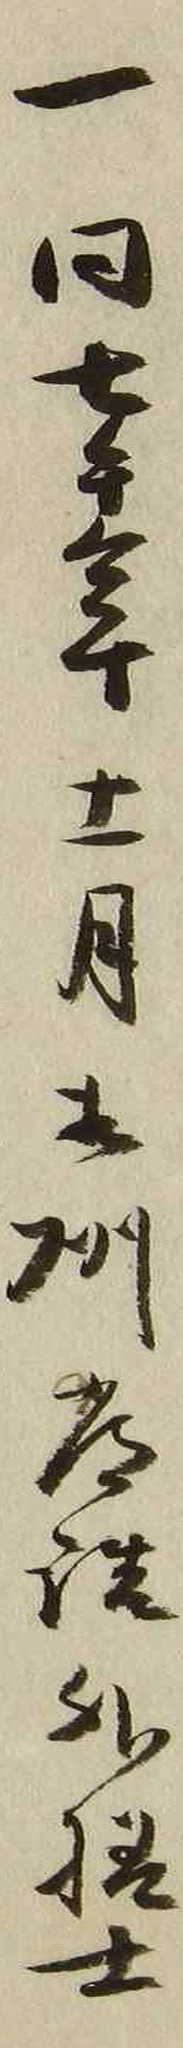一同七午年十一月相州常詰外様士
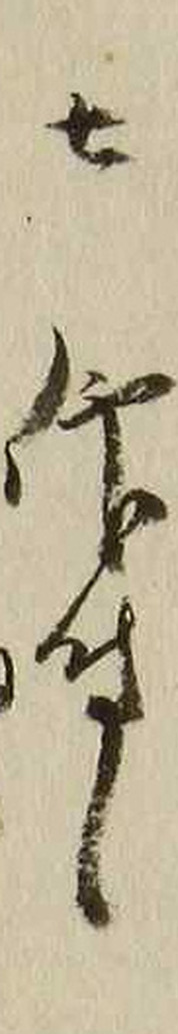被仰付候
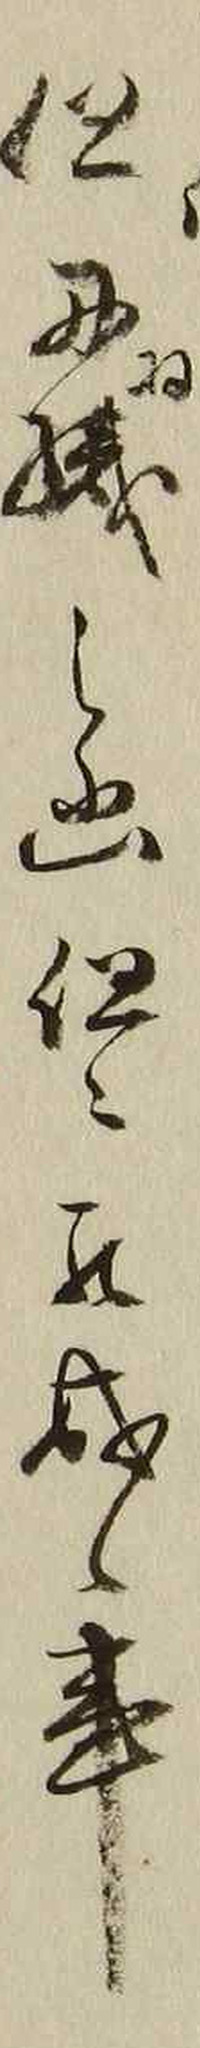但丹羽織之丞組ニ罷成候事
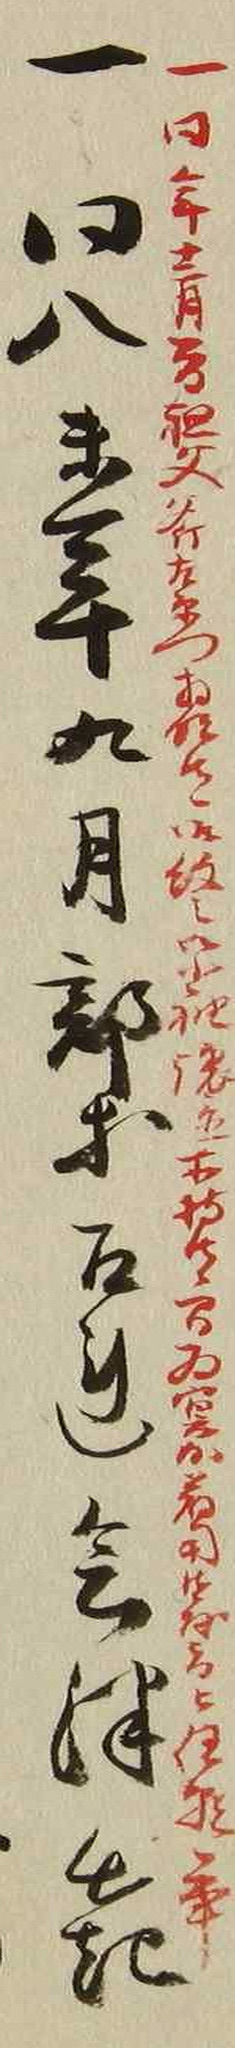一同八未年九月郎等召連会津出起
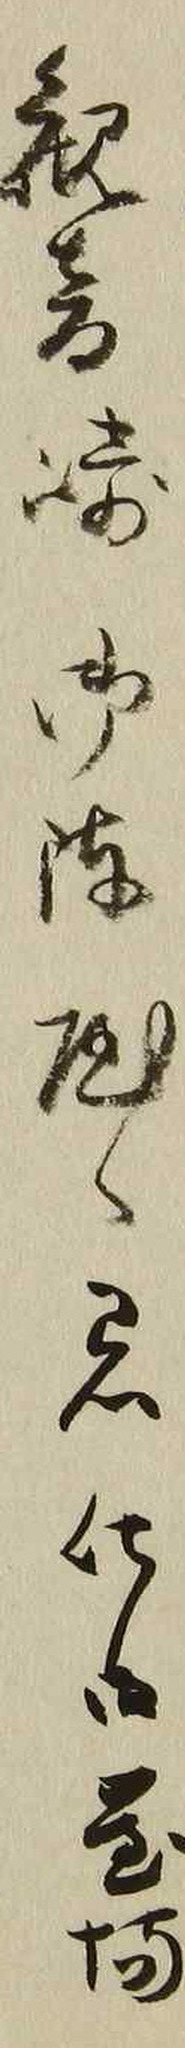観音崎御陣屋へ着仕御台場
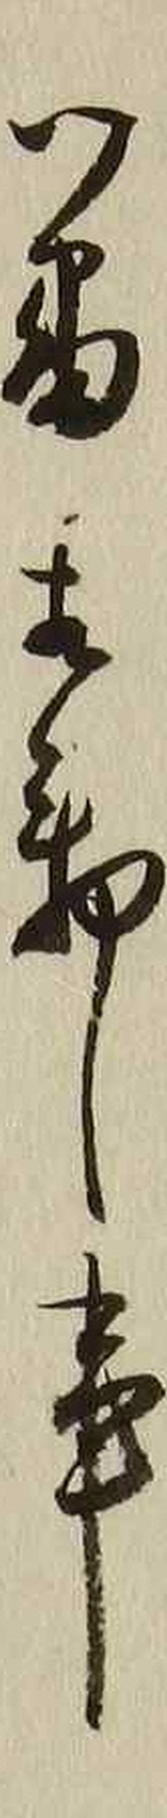御番相勤候事
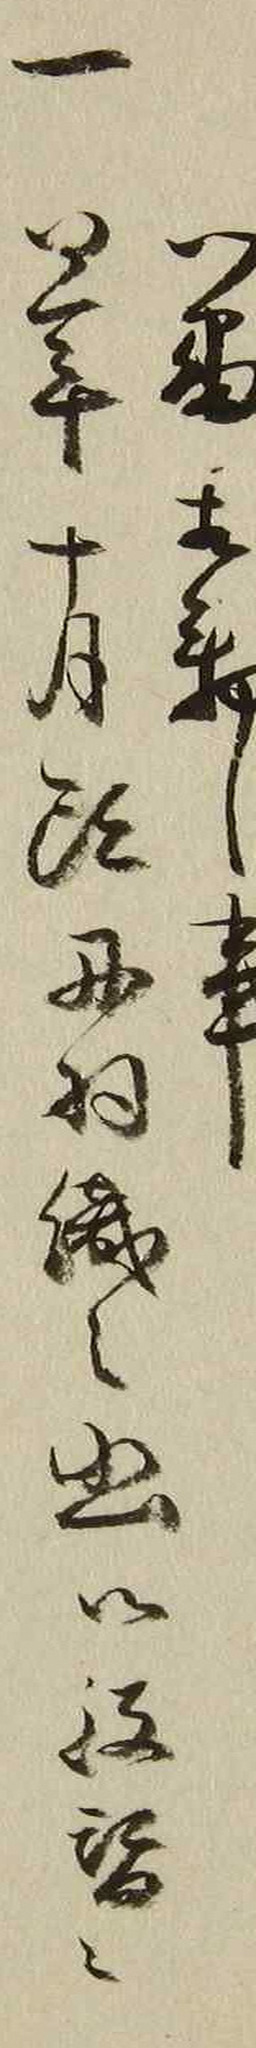一同年十月頭丹羽織之丞御役替ニ
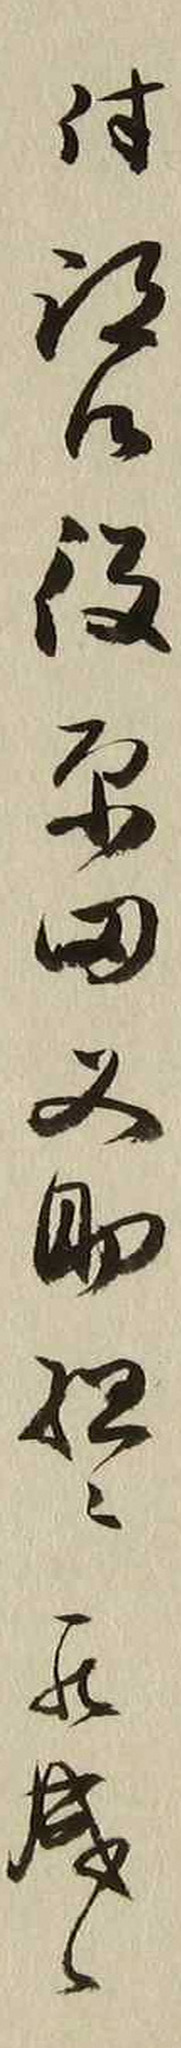付跡御役原田又助組ニ罷成候
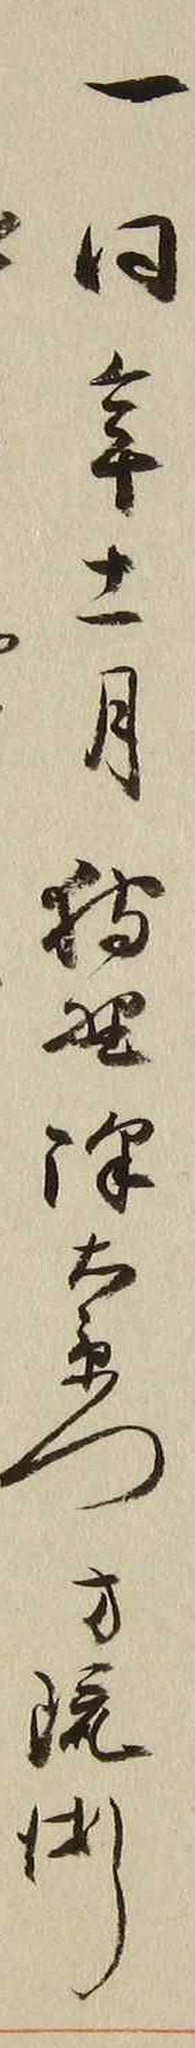一同年十一月狩野沢右衛門方銃術
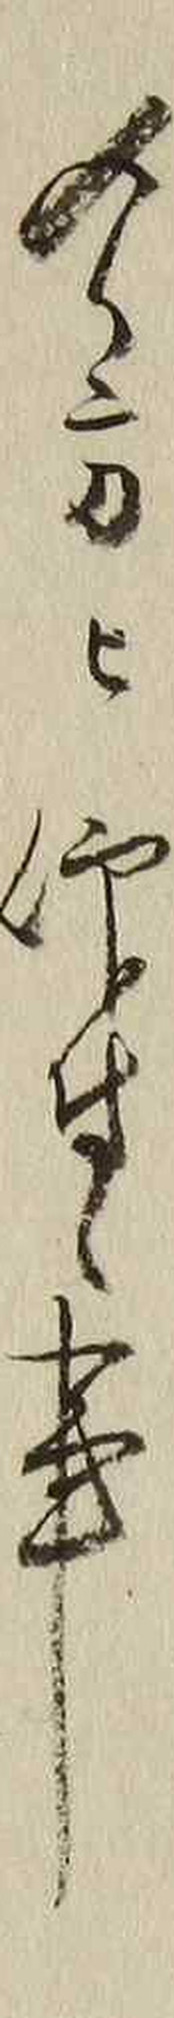〆り方被仰付候事
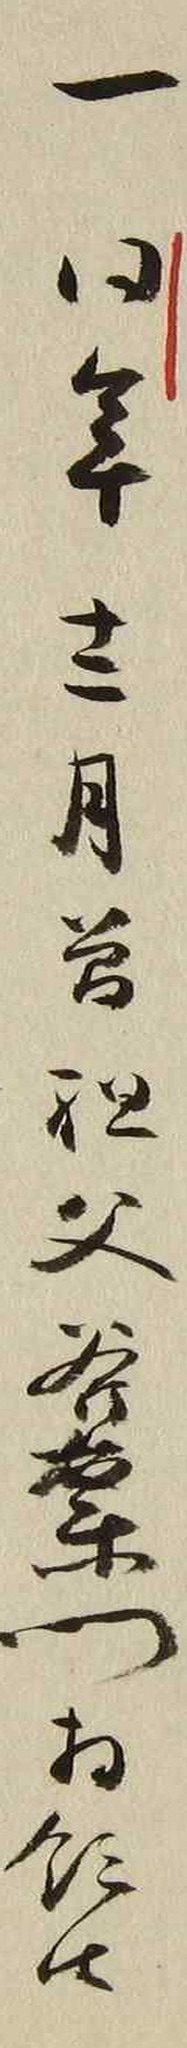一同年十二月曽祖父斧右衛門拝領仕
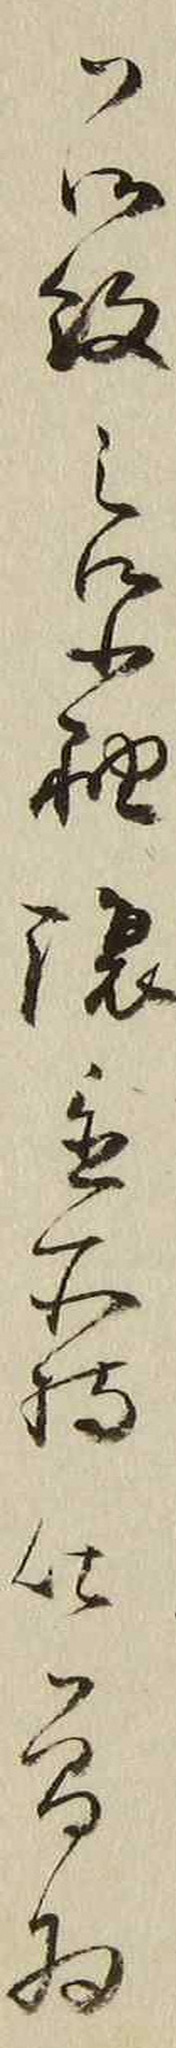候御紋之御小袖譲置所持仕候間為
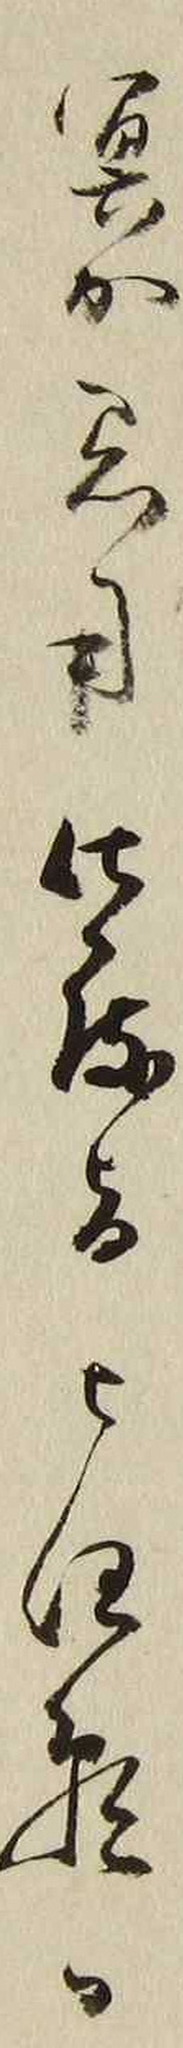冥加着用仕度旨被任願候
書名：諸士系譜　巻之288　さ之部20
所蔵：会津若松市立会津図書館
